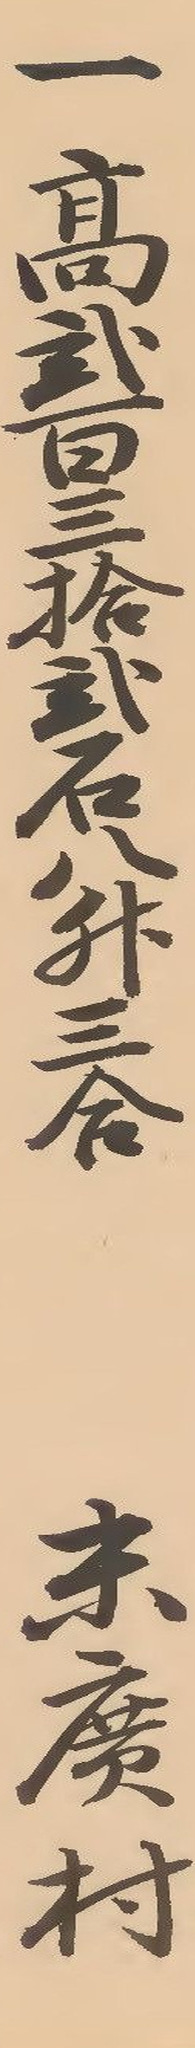一高弐百三拾弐石八升三合末広村
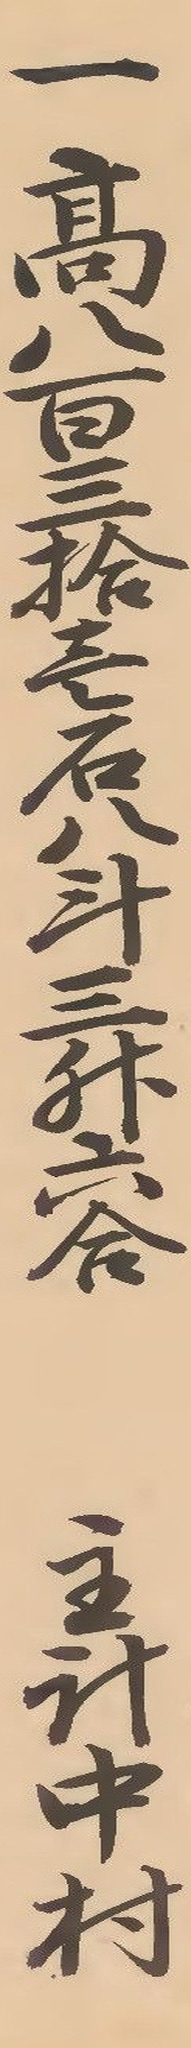一高八百三拾壱石八斗三升六合主計中村
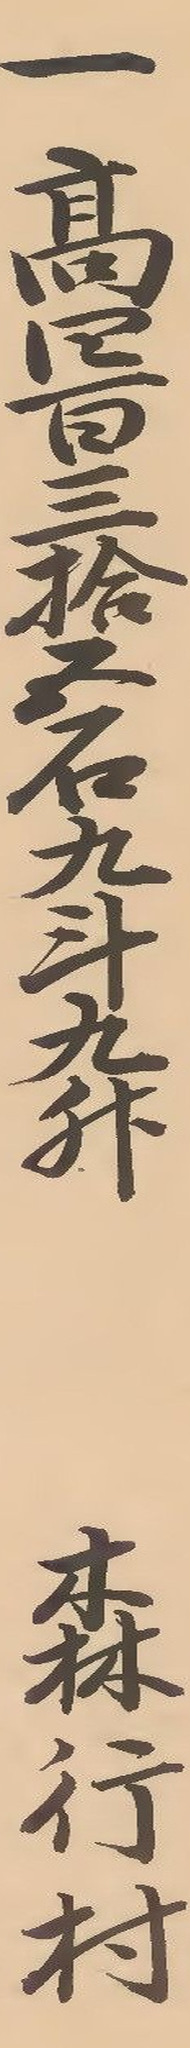一高四百三拾五石九斗九升森行村
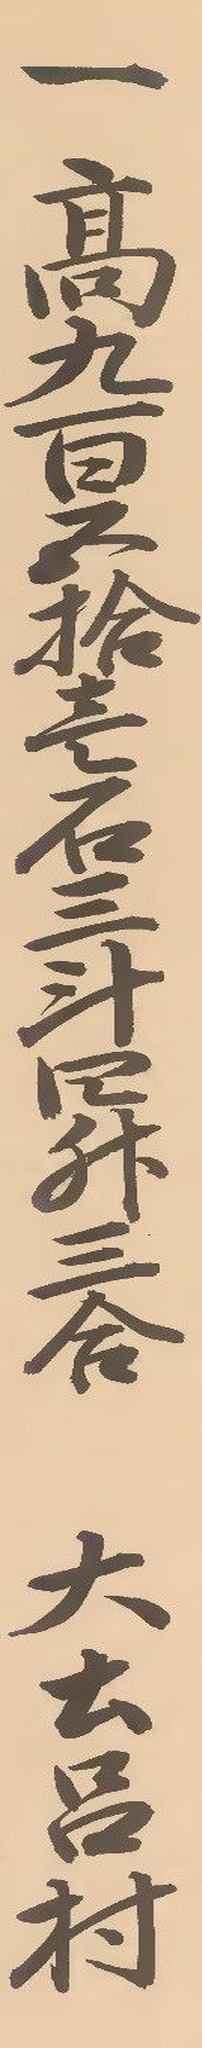一高九百五拾壱石三斗四升三合大土呂村
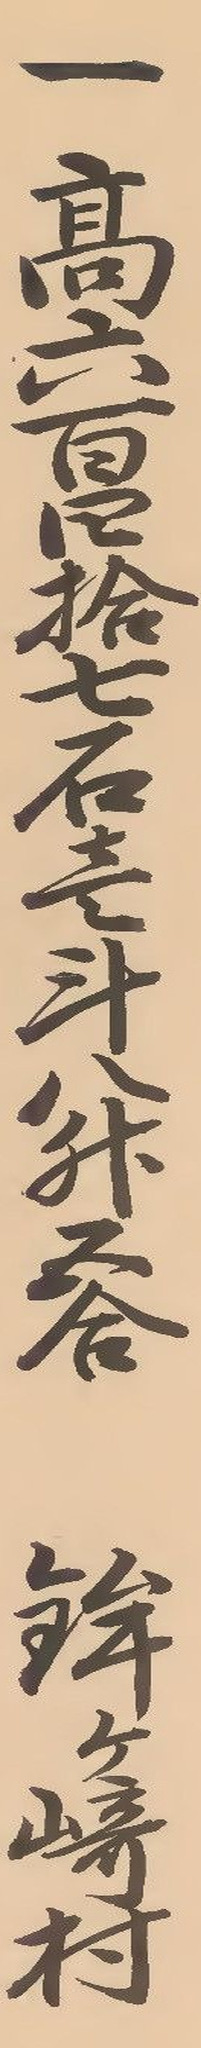一高六百四拾七石壱斗八升五合鉾ヶ崎村
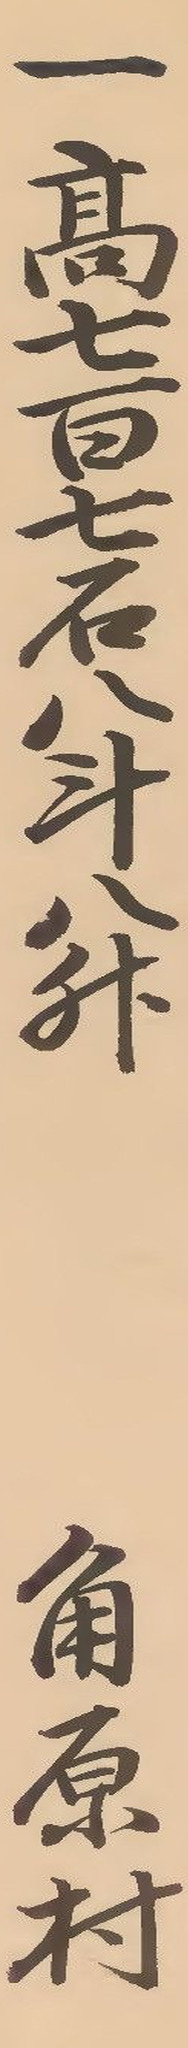一高七百七石八斗八升角原村
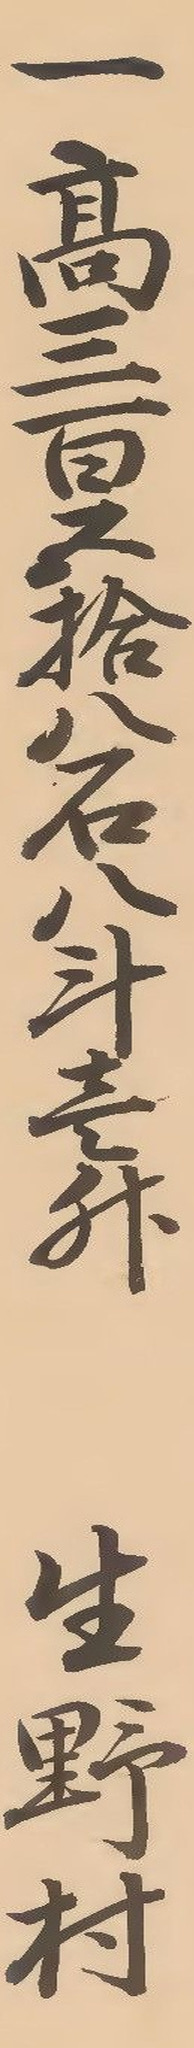一高三百五拾八石八斗壱升生野村

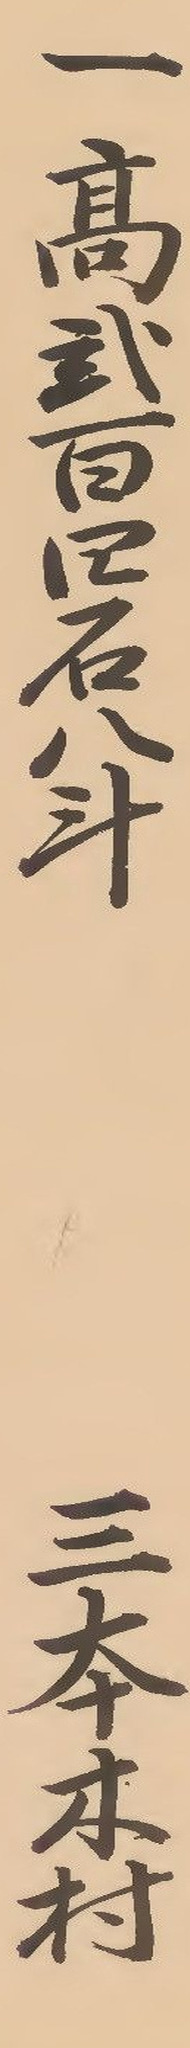一高弐百四石八斗三本木村
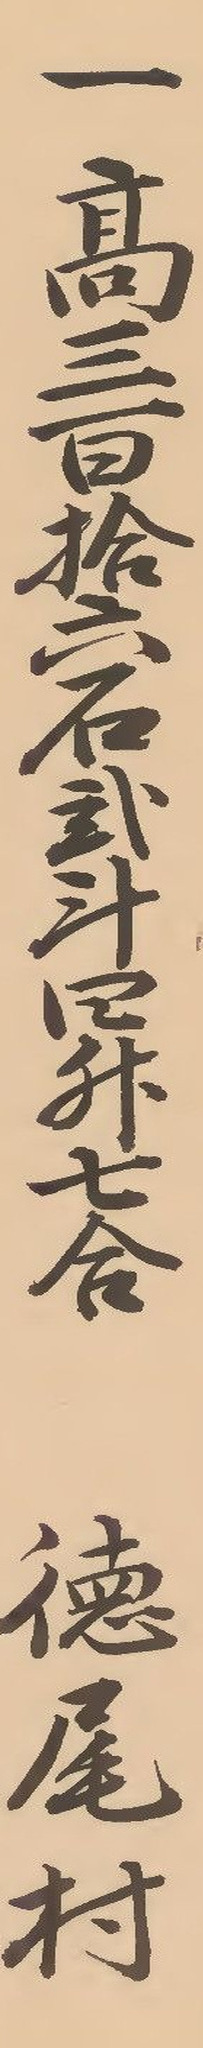一高三百拾六石弐斗四升七合徳尾村
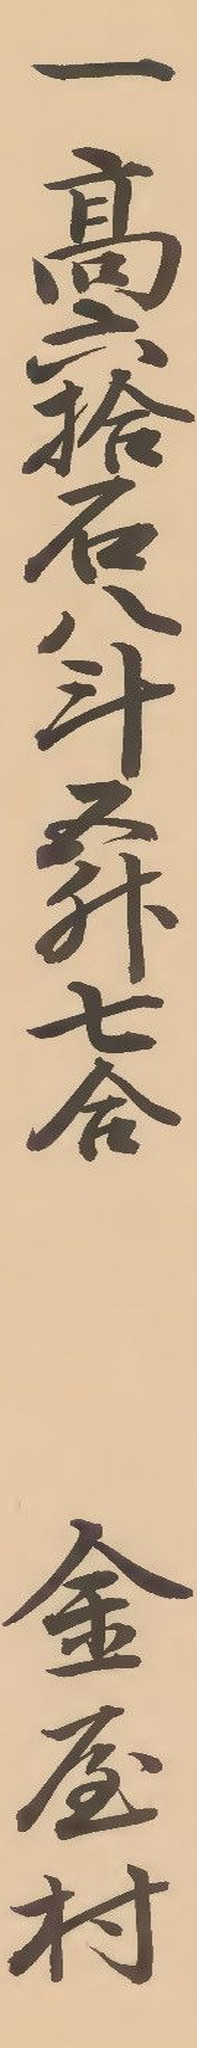一高六拾石八斗五升七合金屋村
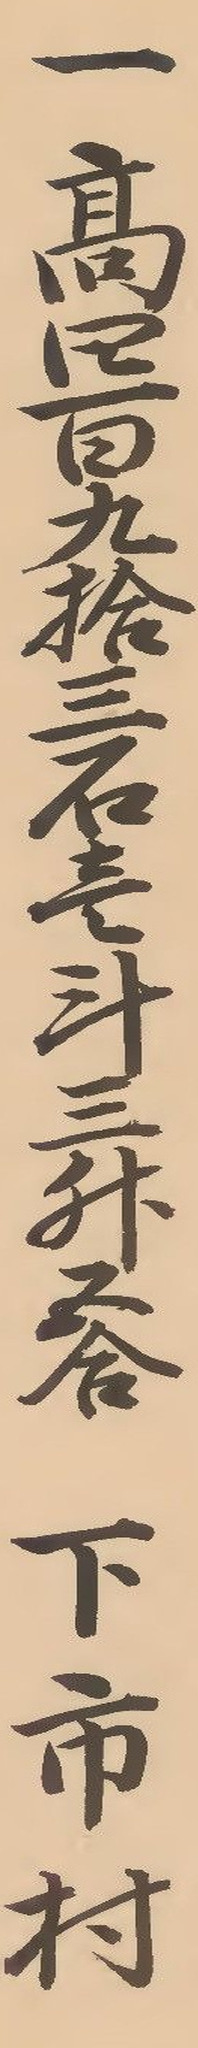一高四百九拾三石壱斗三升五合下市村
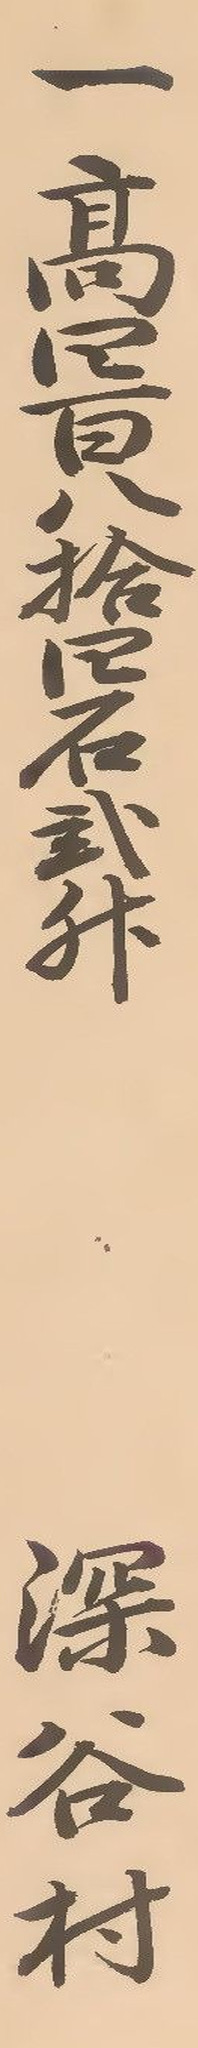一高四百八拾四石弐升深谷村
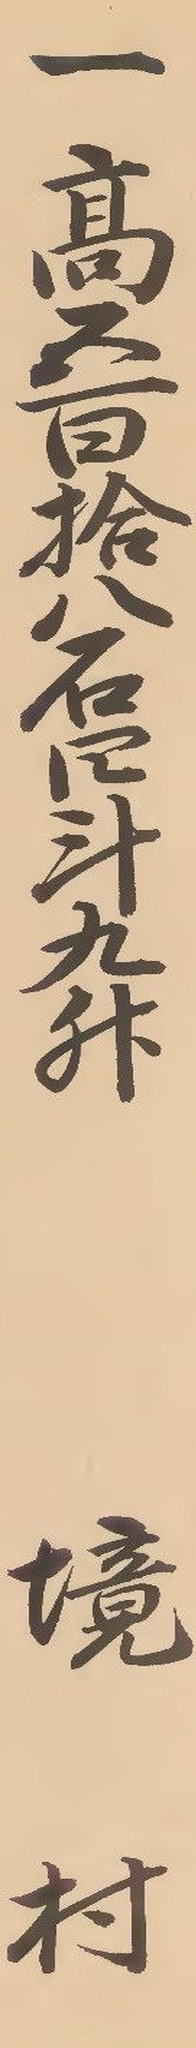一高五百拾八石四斗九升境村
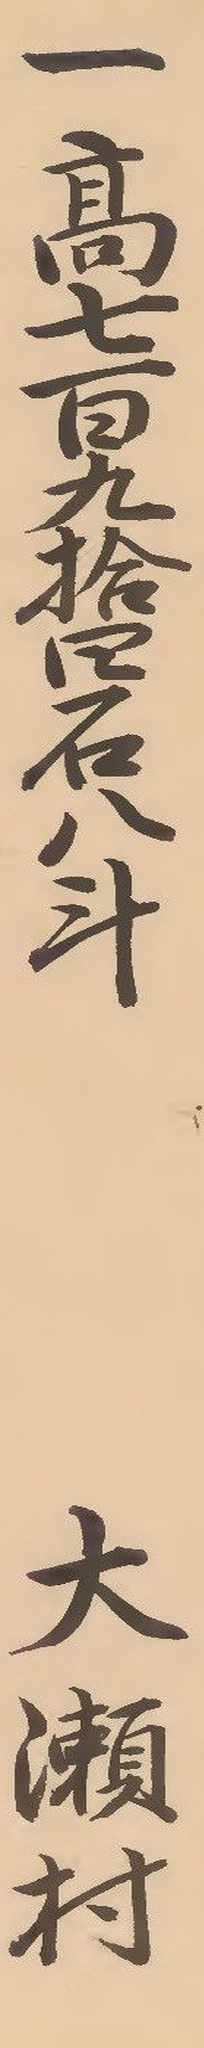一高七百九拾四石八斗大瀬村
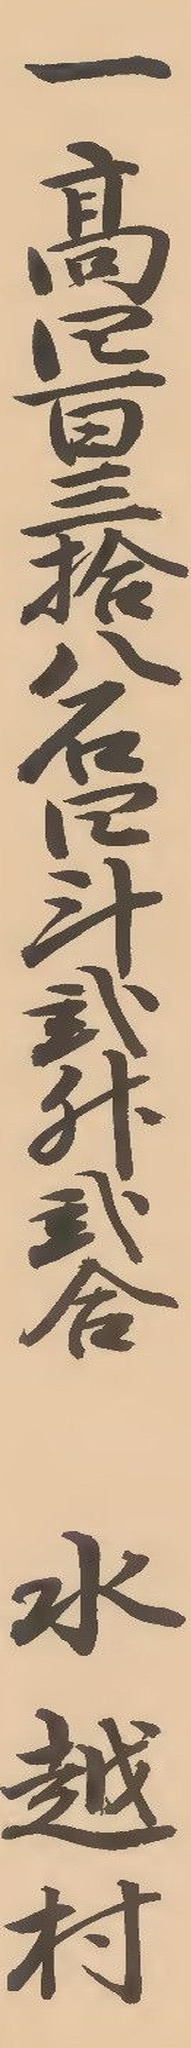一高四百三拾八石四斗弐升弐合水越村

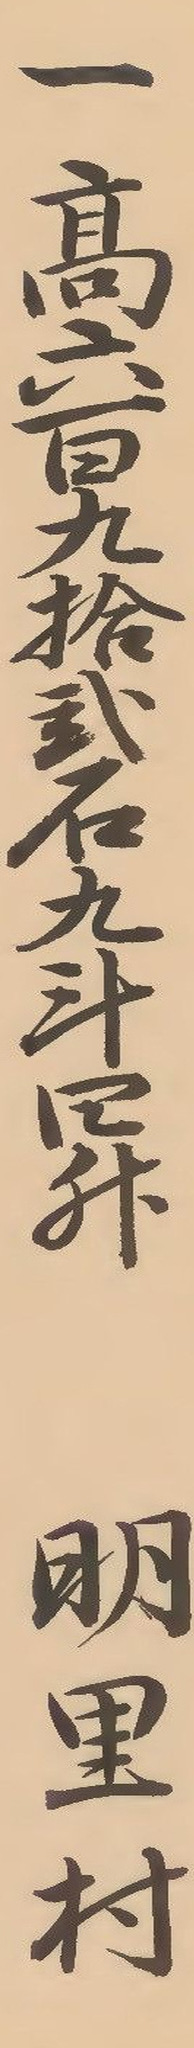一高六百九拾弐石九斗四升明里村
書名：越前国郷帳
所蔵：国立公文書館 National Archives of Japan
